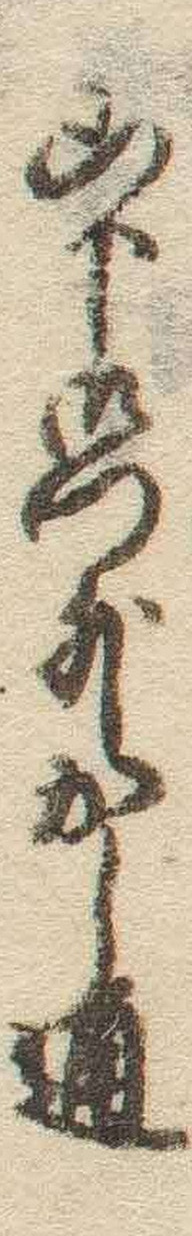山下御門外かし通

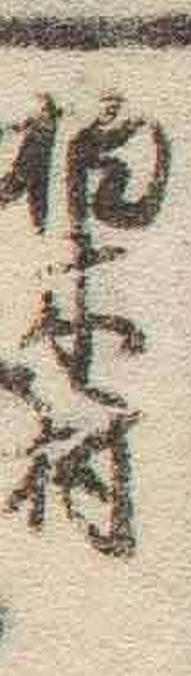柏木村
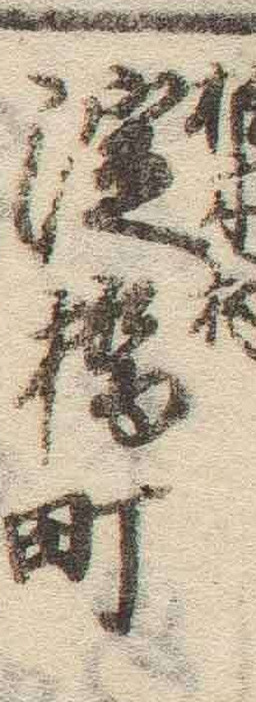淀橋町
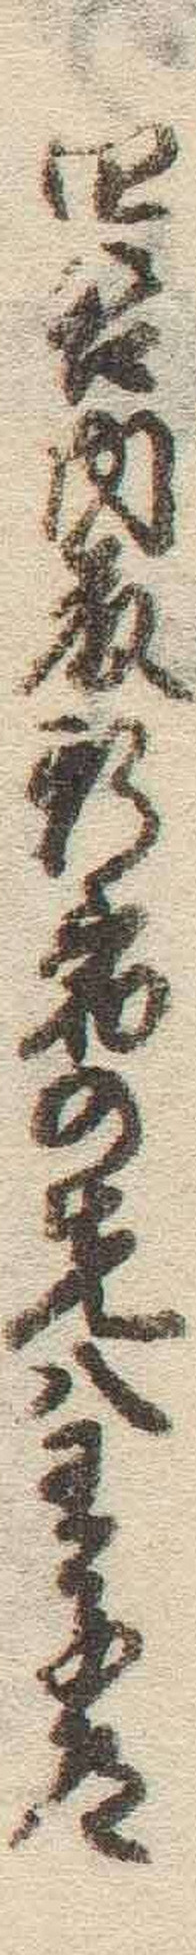四谷内藤新宿の先八王子道
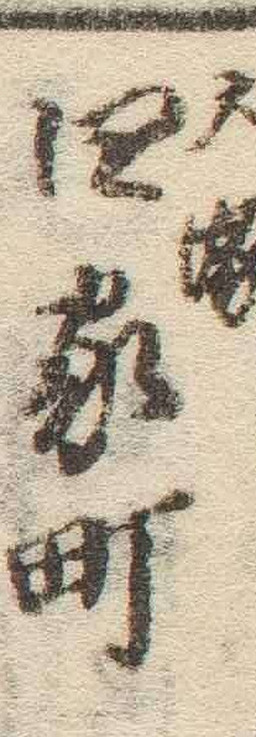四家町
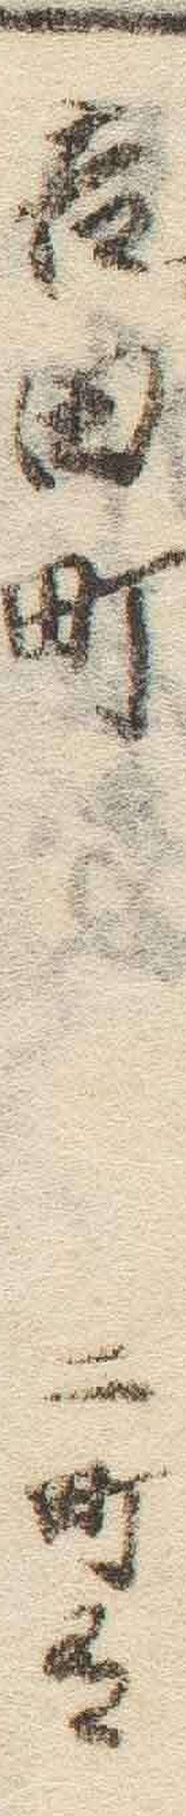吉田町二町有
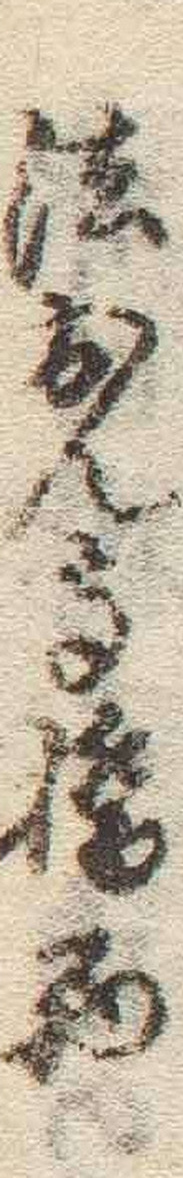法おん寺橋西
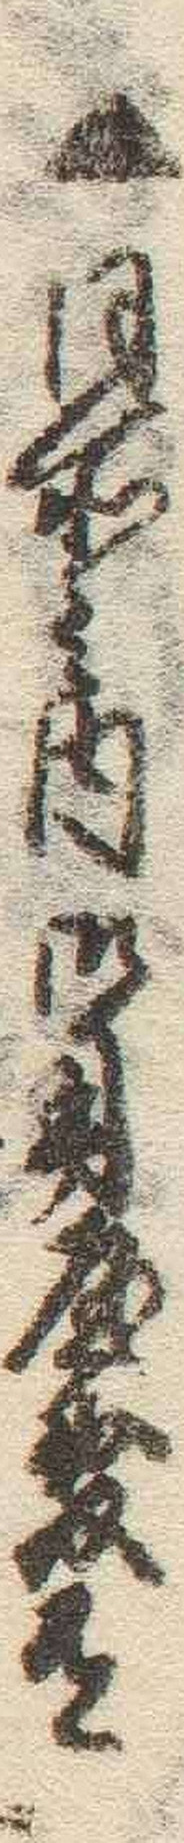▲同所之内御用屋敷有
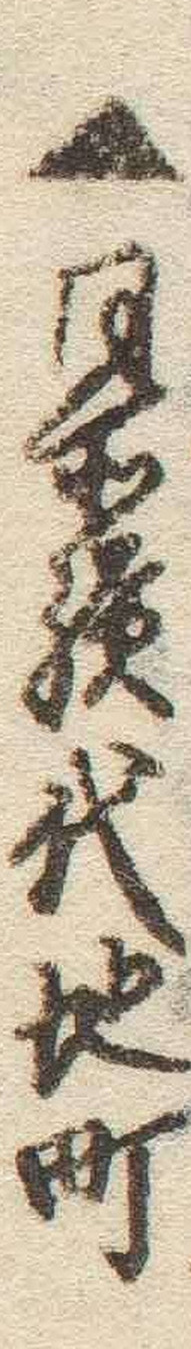▲同所続代地町
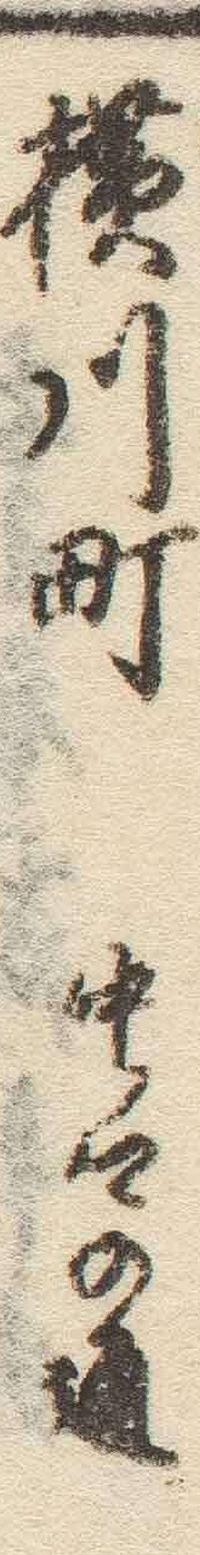横川町中ノ郷の通
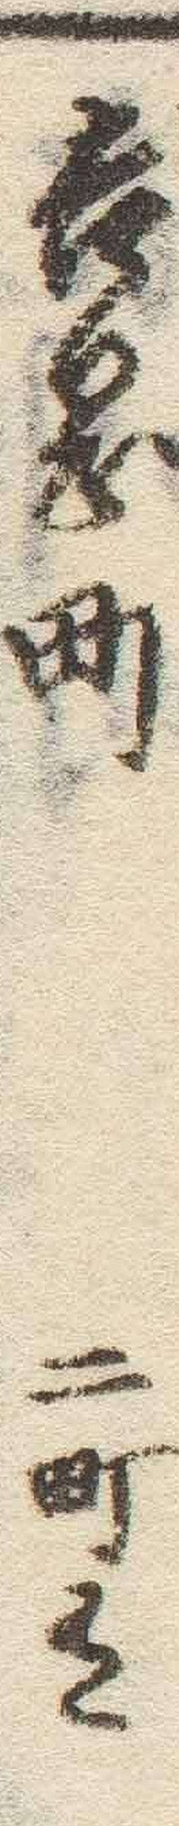吉岡町二町有
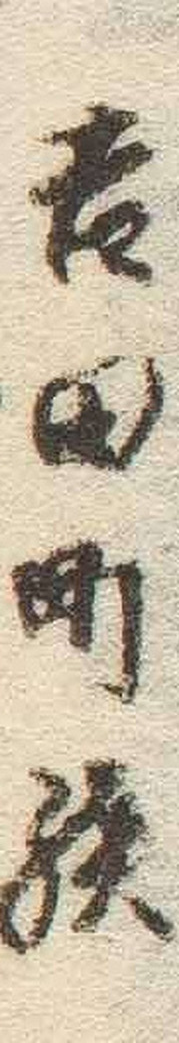吉田町続
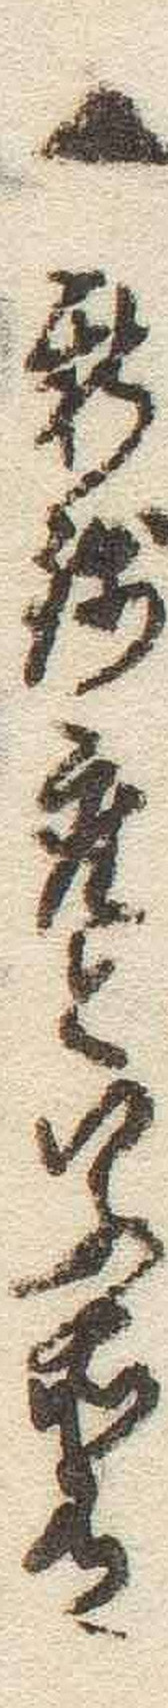▲新銭座といふ所有
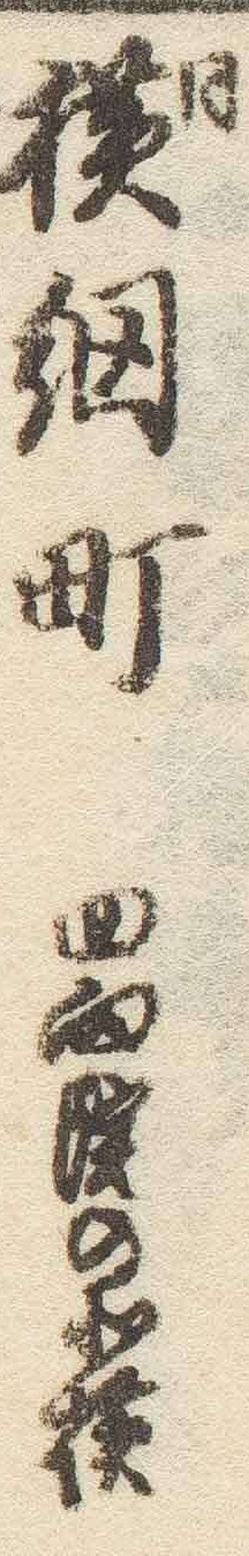横網町回向院の北横
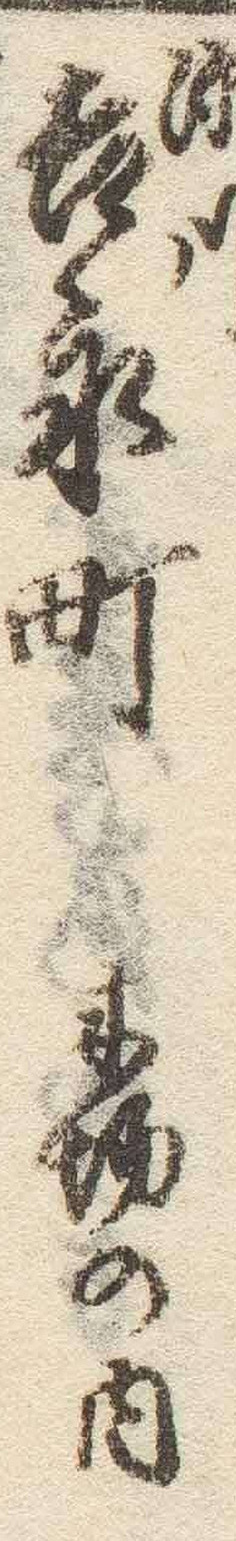吉永町木場の内
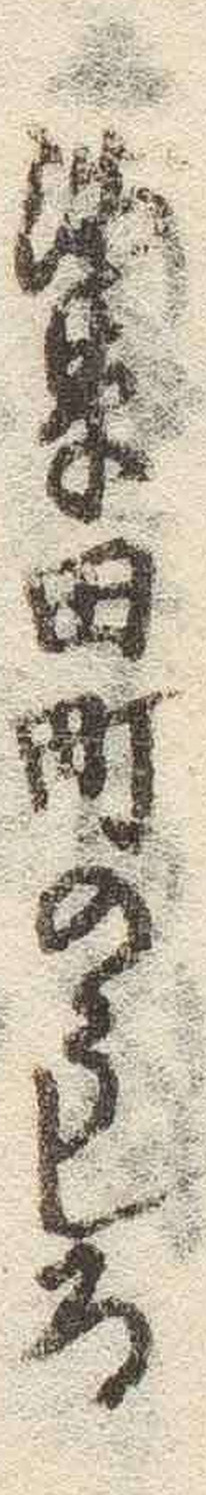浅草田町のうしろ
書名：江戸町独案内
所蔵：東京学芸大学附属図書館 国文学研究資料館
